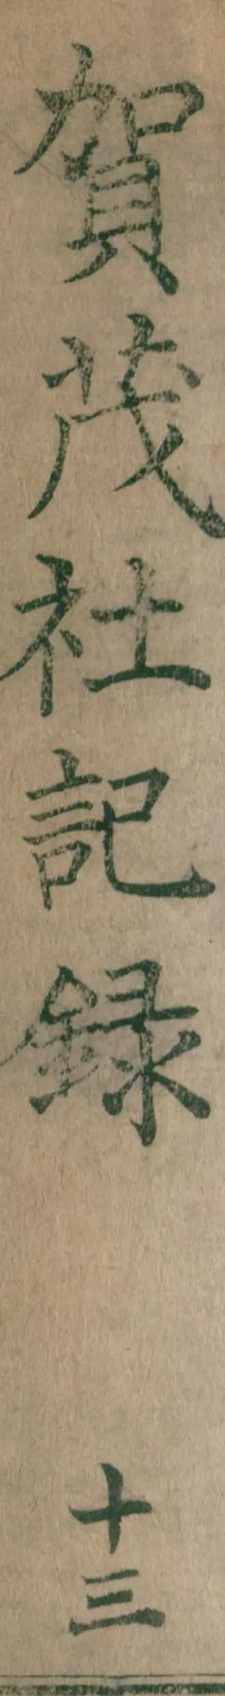賀茂杜記録十三

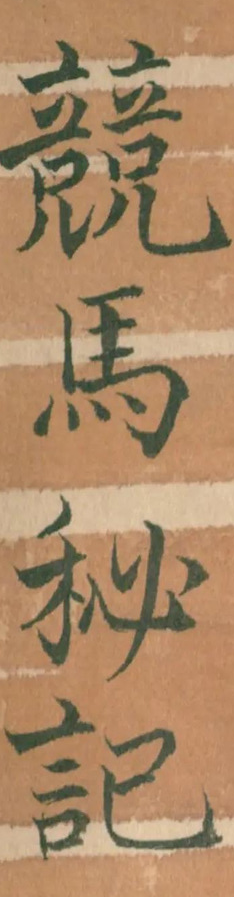競馬秘記

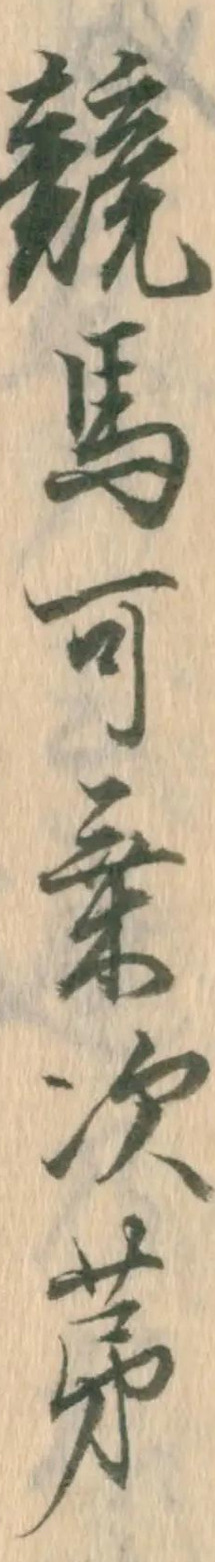競馬可乗次第
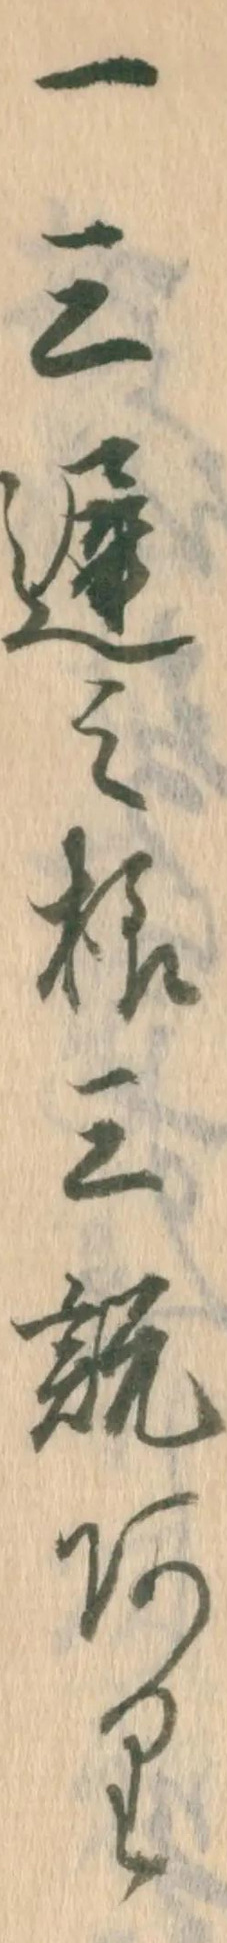一三遅之様三説あり
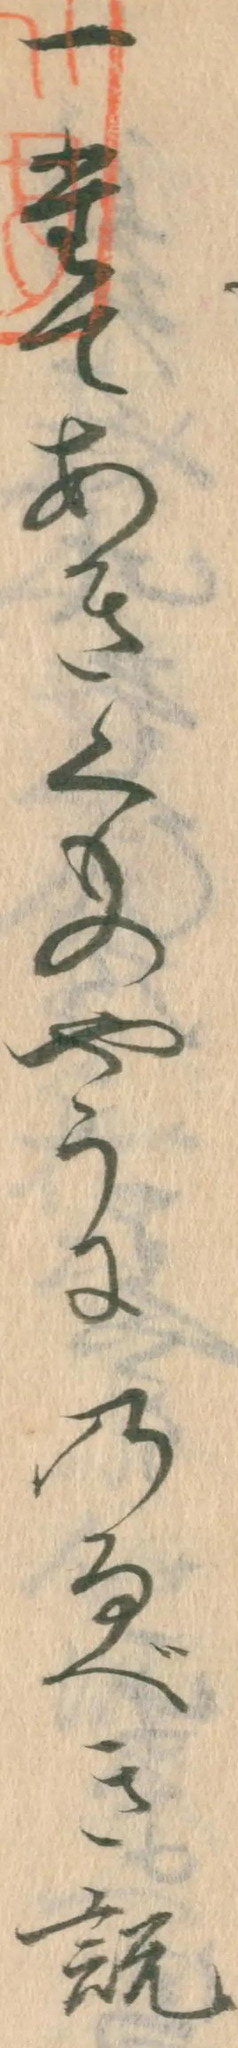一たてあきくものやうにのるべき説
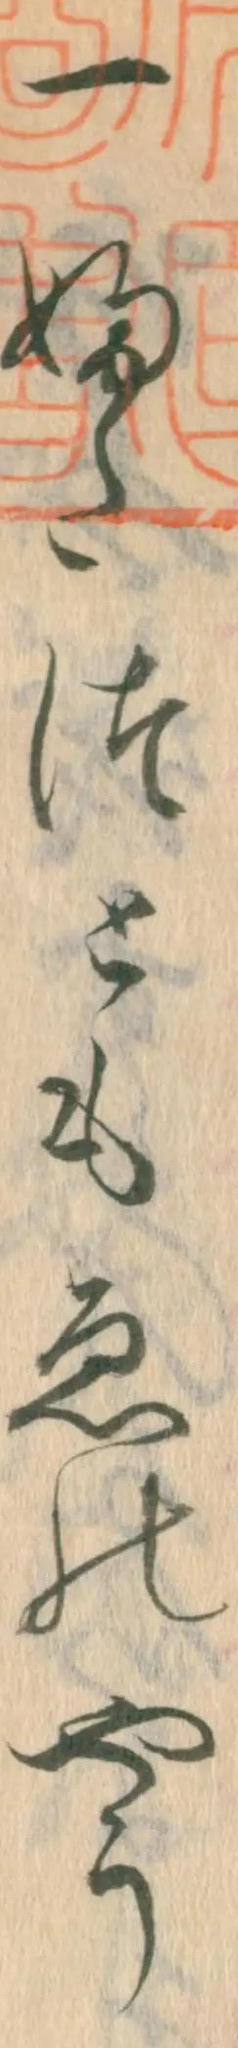一ふたつともゑのやう
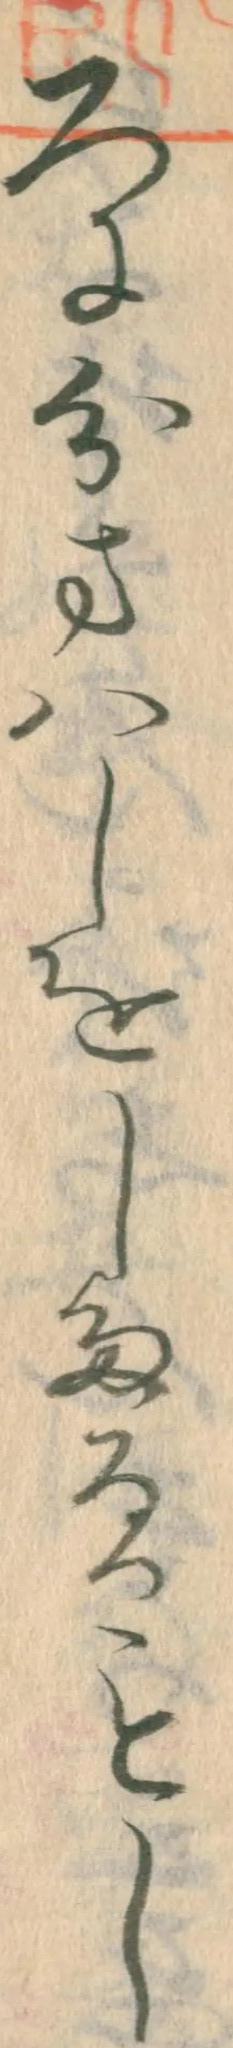一まろに分まはしをしたるかことし
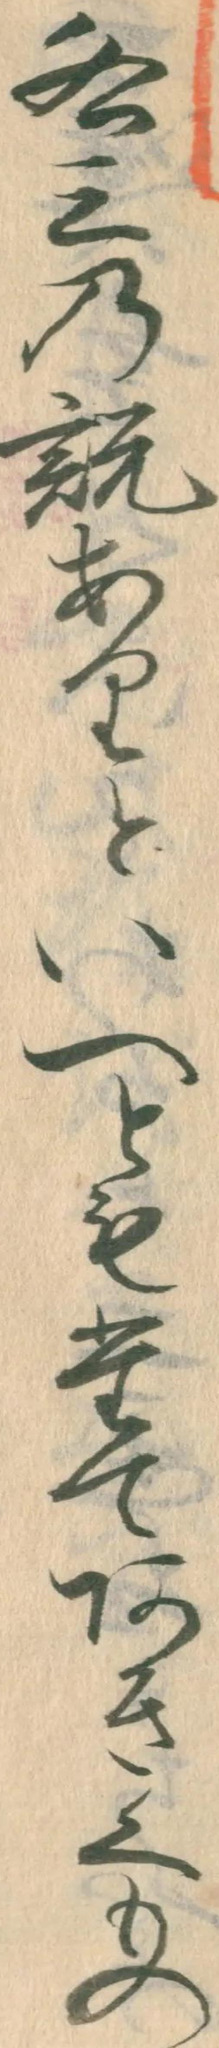各三の説ありといへともたてあきくもの
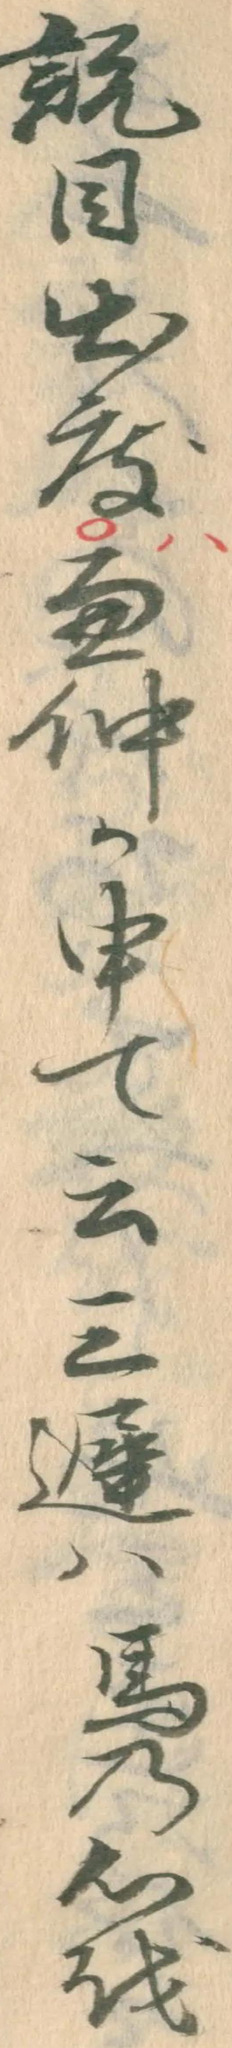説目出度◦兼仲か申て云三遅は馬の心を
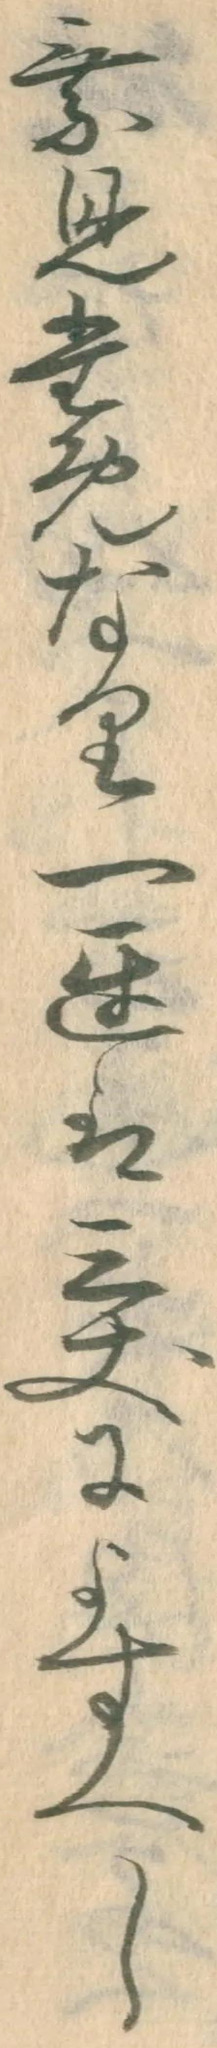乗見ためなり一遅は三丈によすへし
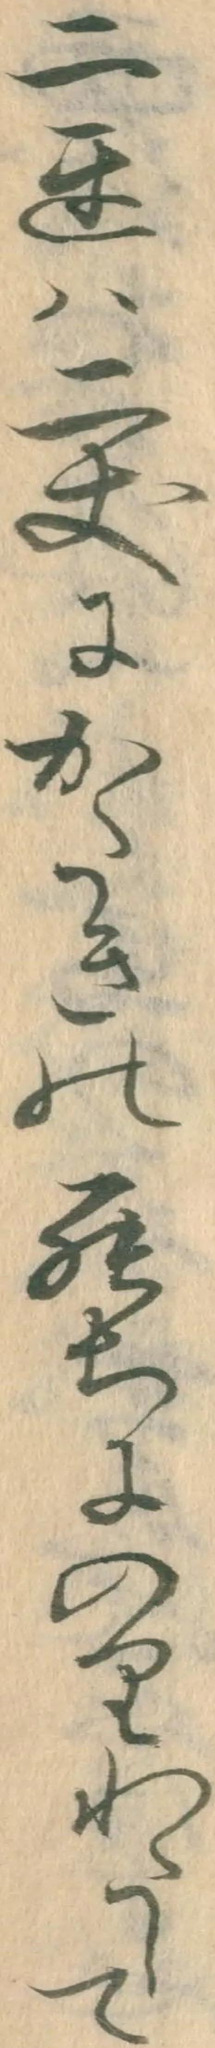二遅は二丈にかたきのらちにのりわたして

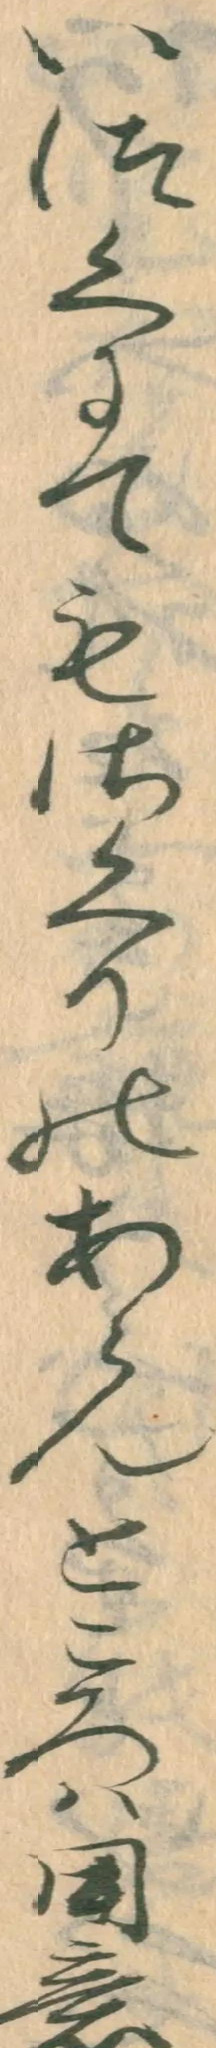いつくにてもさくりのあらんところは用意
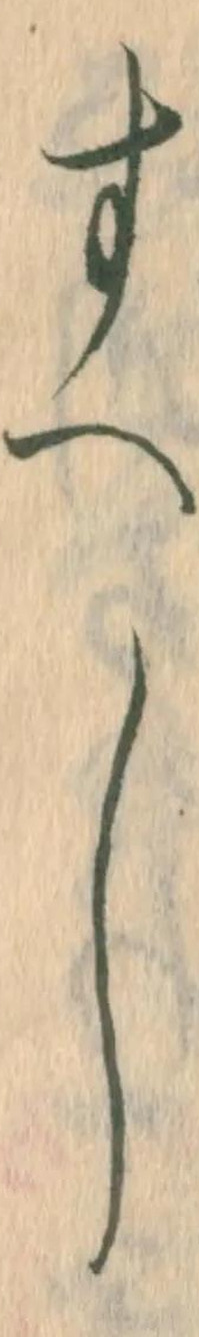すへし
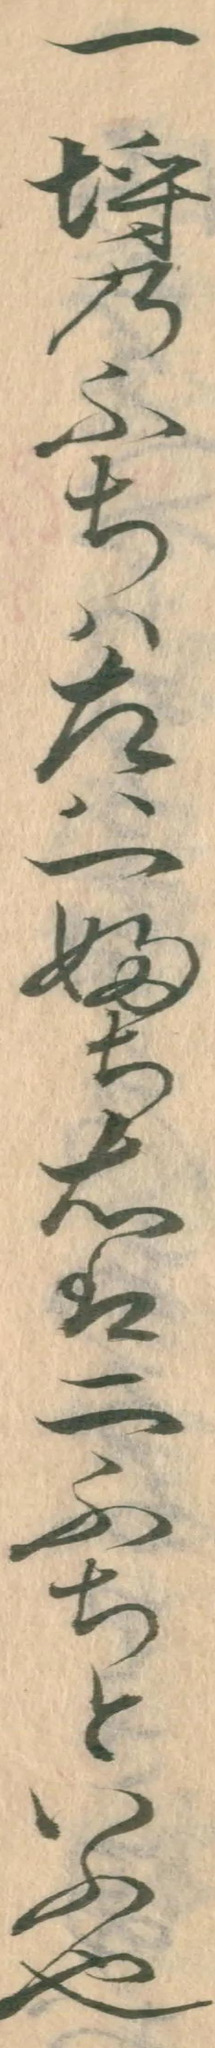一埒のふちは左は一ふち右は二ふちといふ也
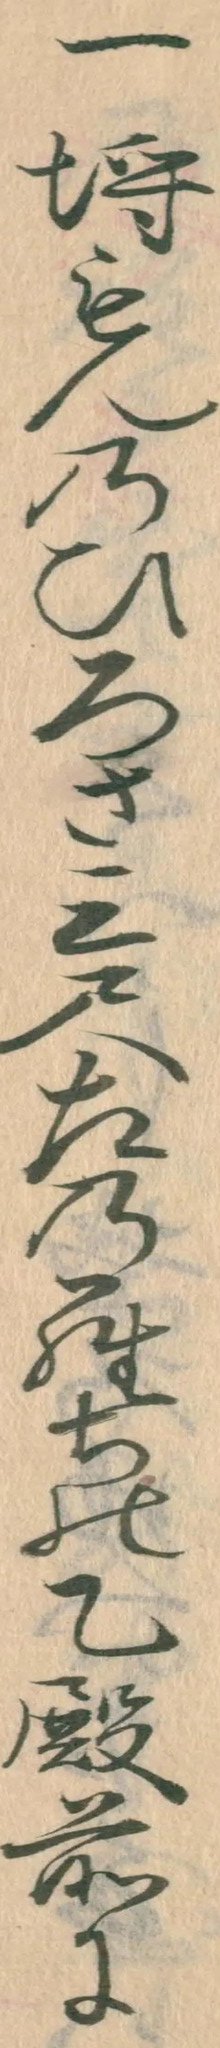一埒もんのひろさ三尺左のらちの乙殿前に
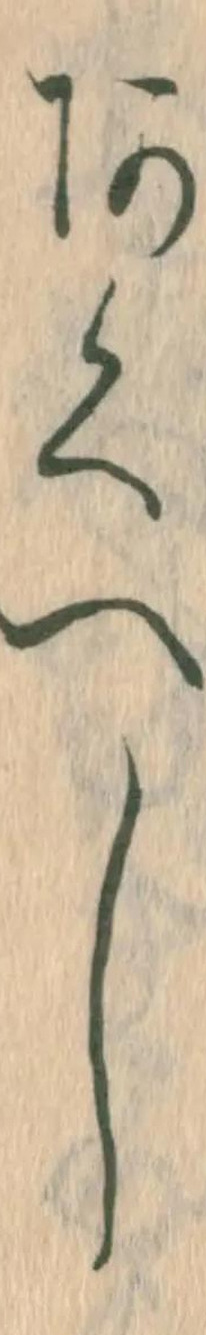あくへし
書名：賀茂社記録. 第13冊
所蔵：国立国会図書館 National Diet Library, JAPAN
